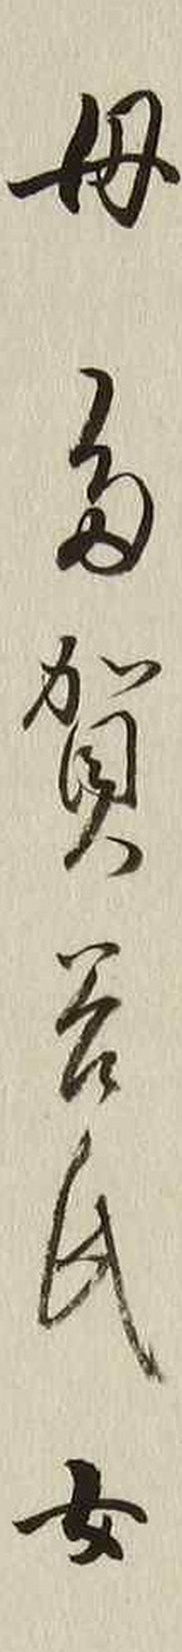母多賀谷氏女
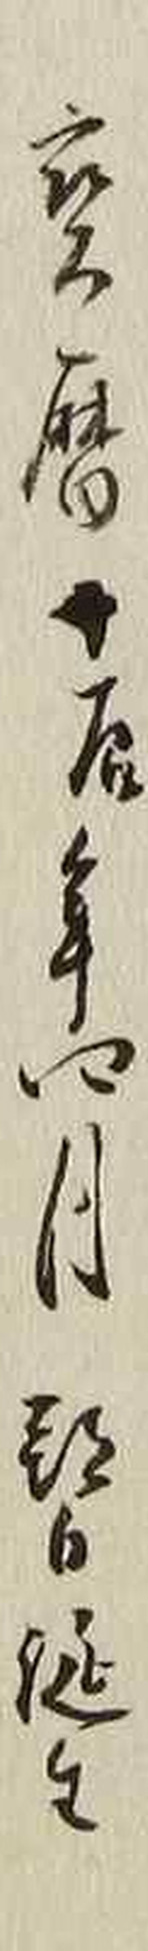宝暦十辰年四月朔日誕生
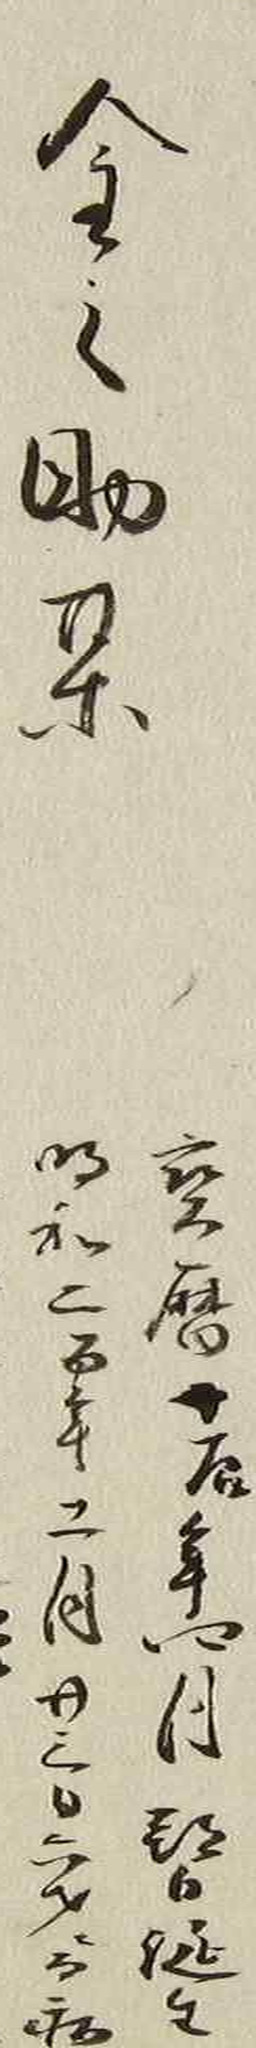金之助某明和二酉十一月廿三日六才に而病
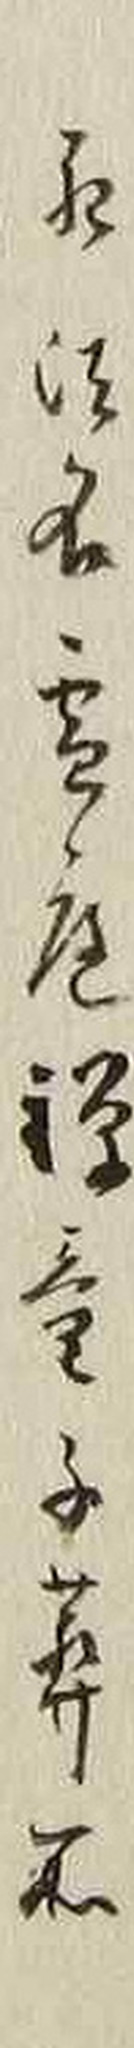死法名雪庭禅童子葬所
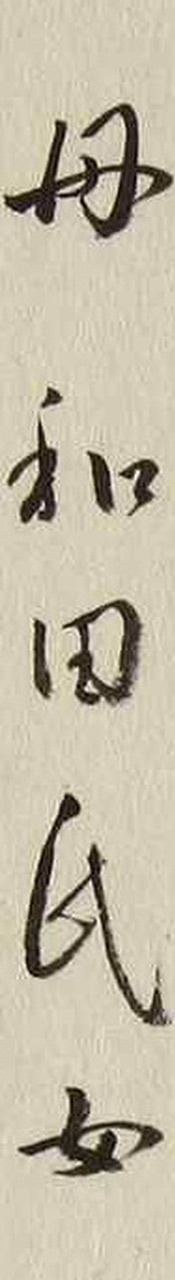母和田氏女
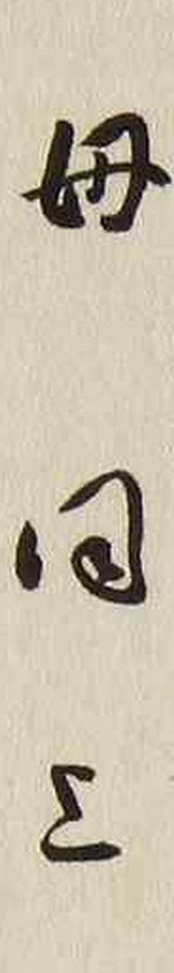母同上

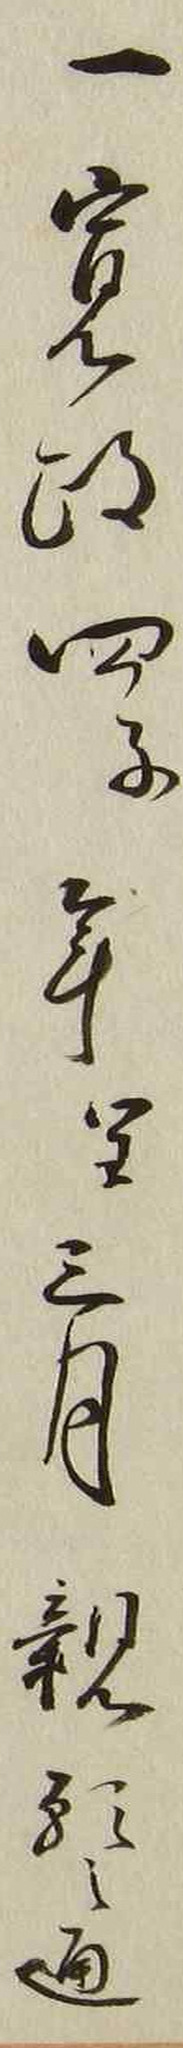一寛政四子年閏三月親願之通
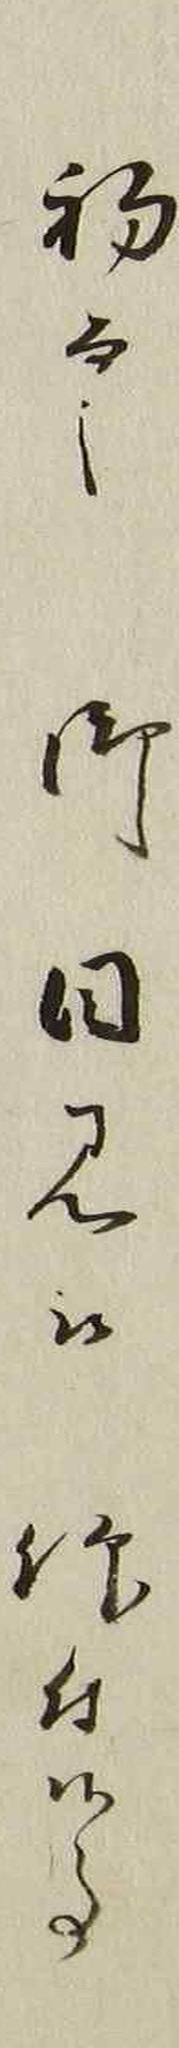初而之御目見被仰付候事
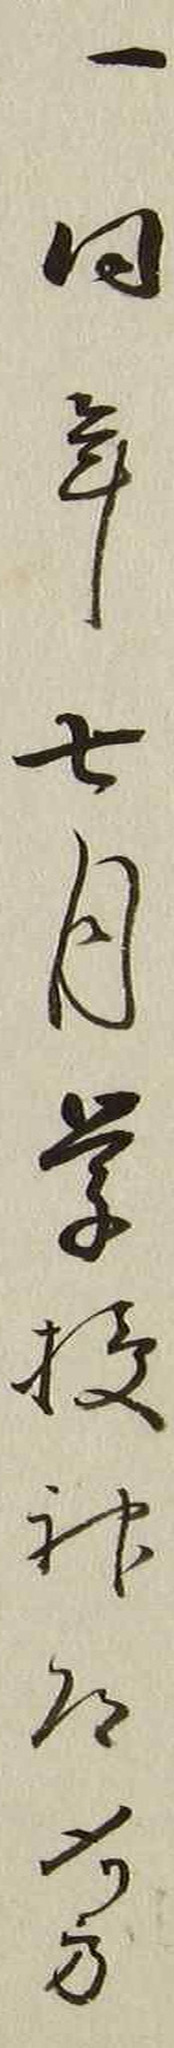一同年七月学授神道〆り方
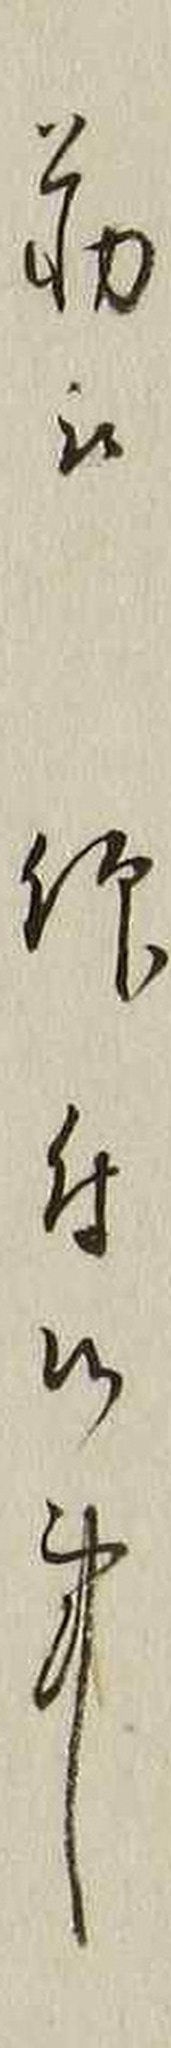勤被仰付候事
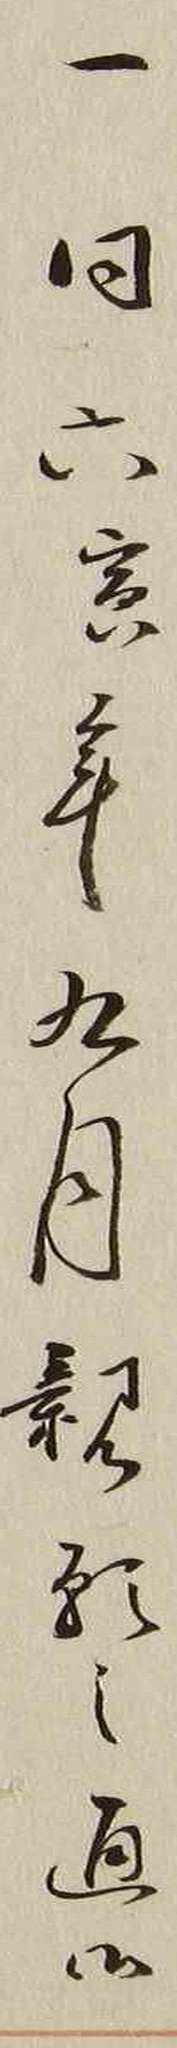一同六寅年九月親願之通御
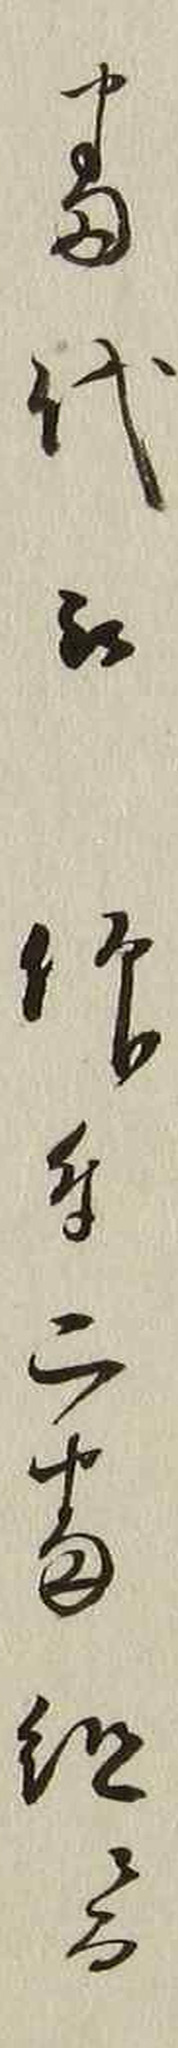番代被仰付二番組に而
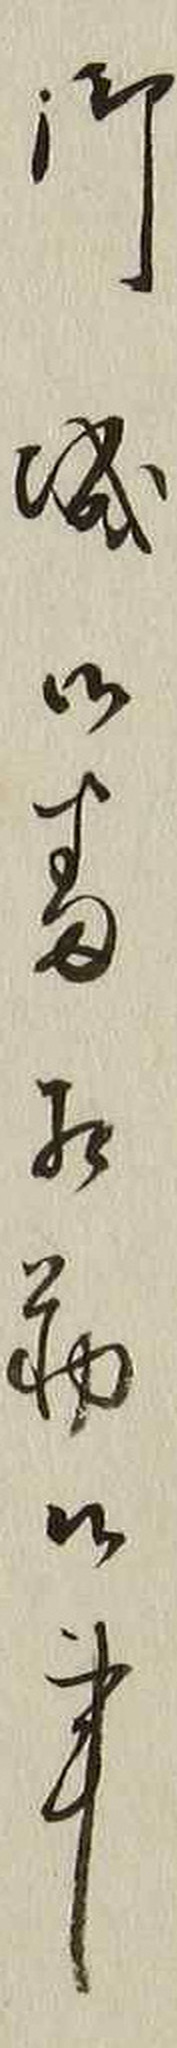御城御番相勤候事
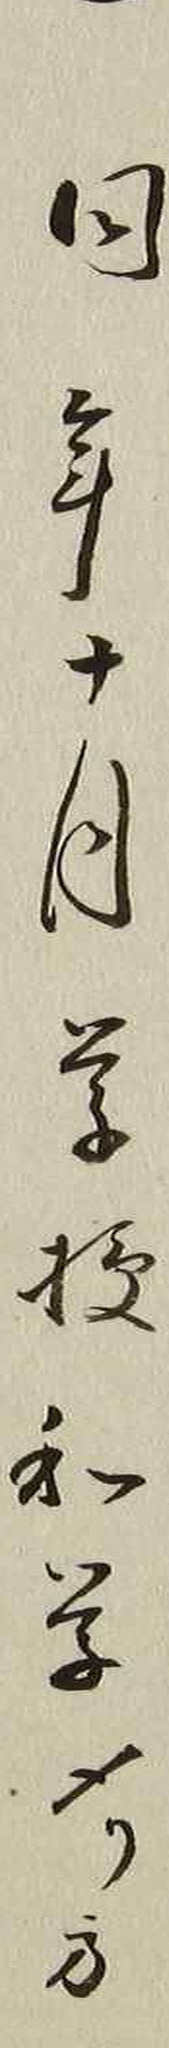一同年十月学授和学〆り方
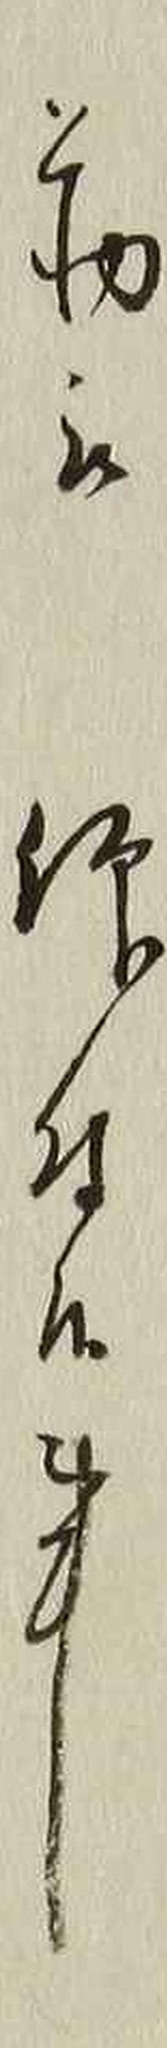勤被仰付候事
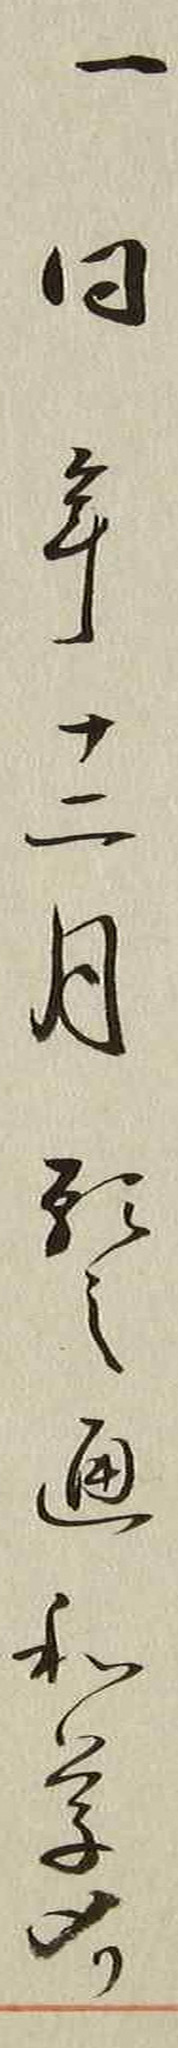一同年十二月願之通和学〆り
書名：諸士系譜　巻之159　な之部1
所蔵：会津若松市立会津図書館
